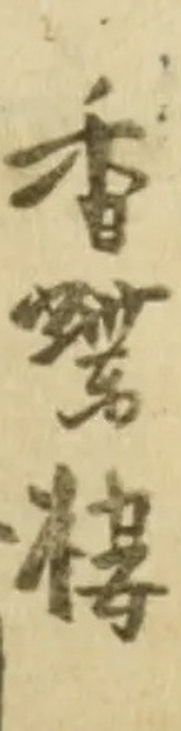香蝶棲
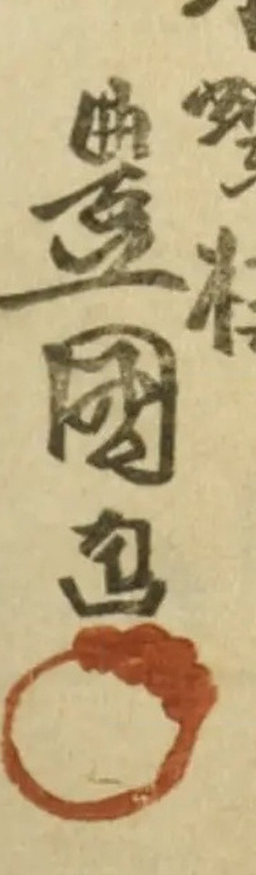豊国画
